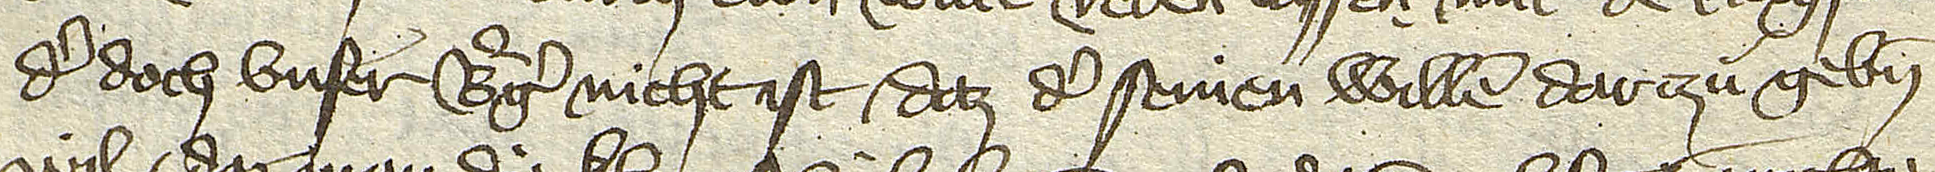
d* doch vnſer B*g* nicht iſt / daʒ d* ſeinen wille* darcʒü gebn*
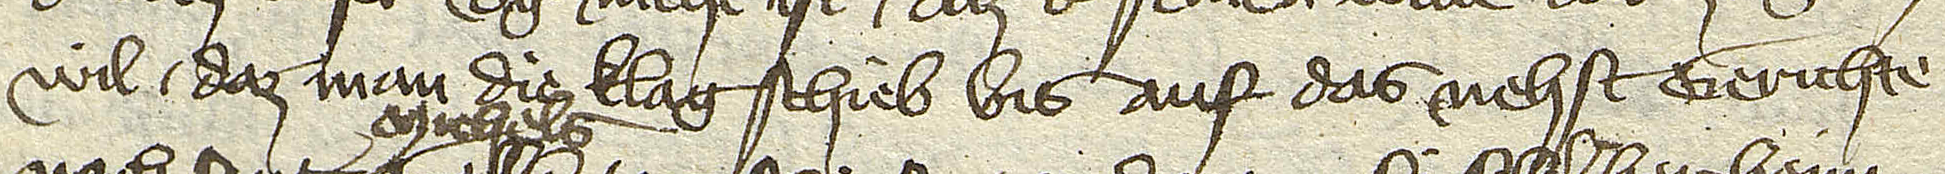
wil / daʒ man die klag ſchieb bis auf das nehſt Gerichte
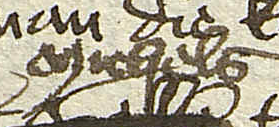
Michels
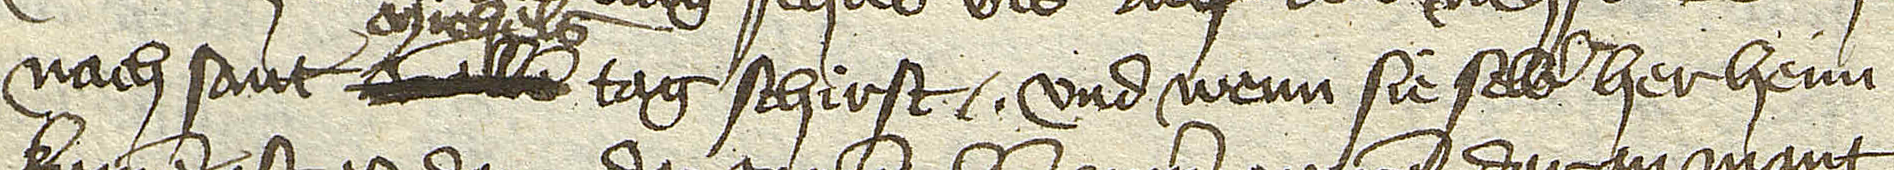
nach ſant Galle* tag ſchirſt / . vnd wenn ſie ſelb* her heim
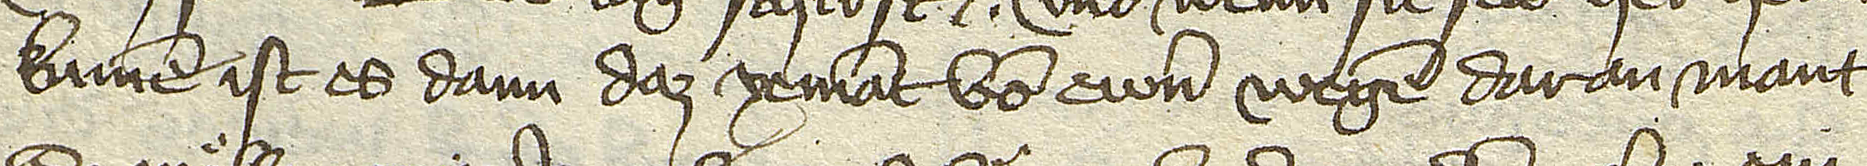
kume* iſt es dann daʒ yemat* vo* ewn* wege* daran mant
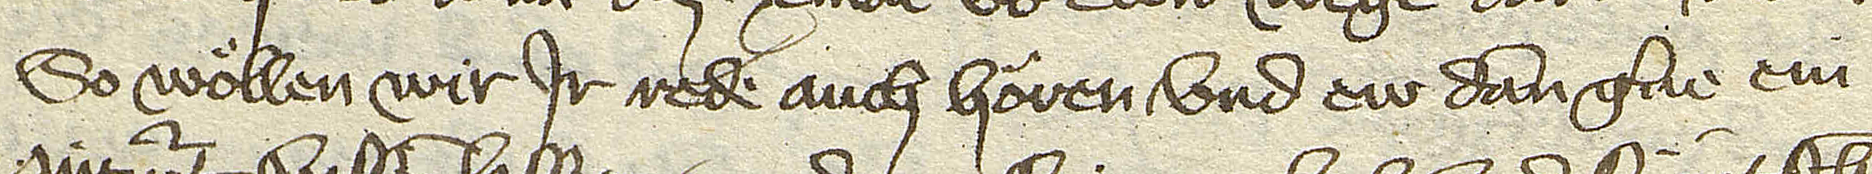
So wöllen wir Ir rede auch hören / vnd ew dan* g*ne ein
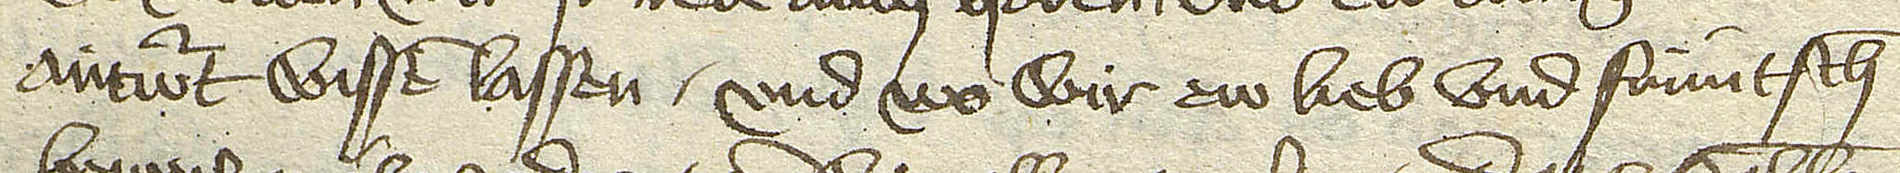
antwt* wiſſe* laſſen / vnd wo wir ew lieb vnd früntſch*
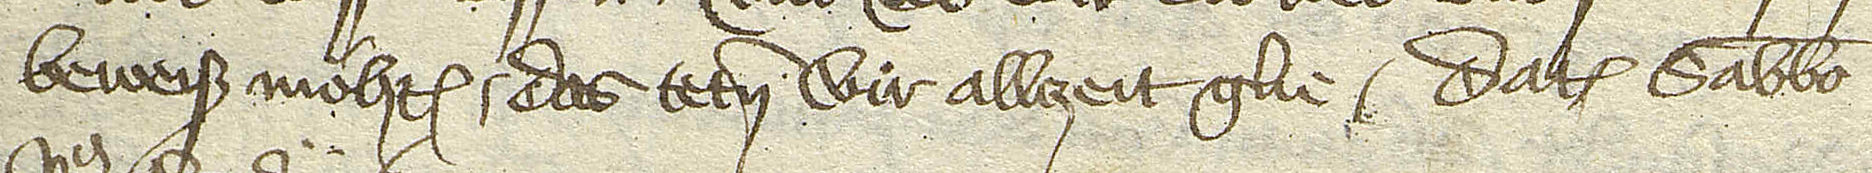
beweiſ* möht* / Das tetn* wir allcʒeit g*ne / Dat* Sabbo*
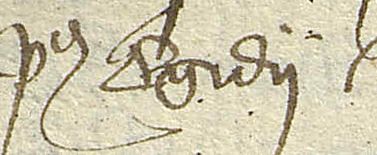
p* Egidii /
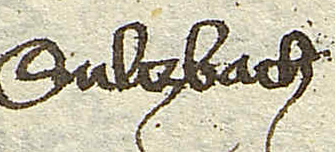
Sulcʒbach
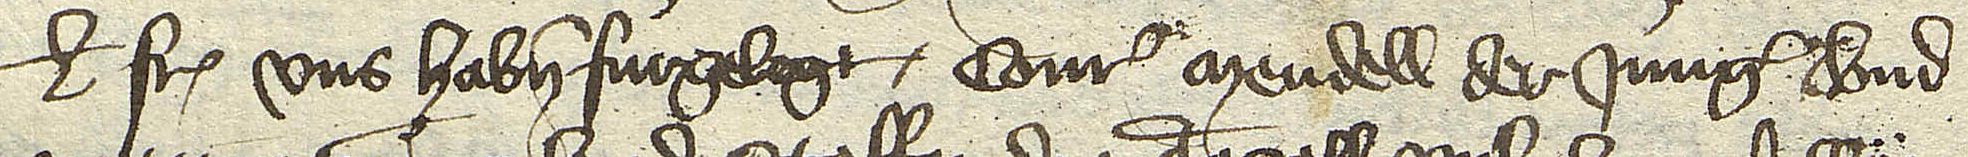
L* fr* vns habn* fürgelegt / Conr* Mendell der Iüng* / vnd
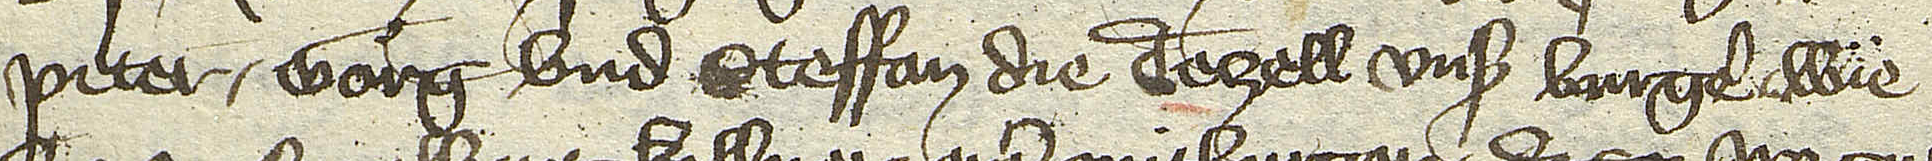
Peter / Görg vnd Steffan die Tecʒell vnſ* burge* / wie
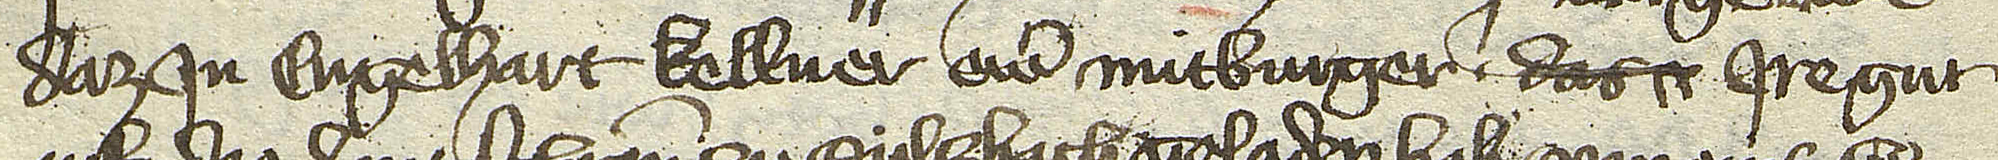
daʒ In Engelhart Kellner ew* mitburger / das i Ire gut
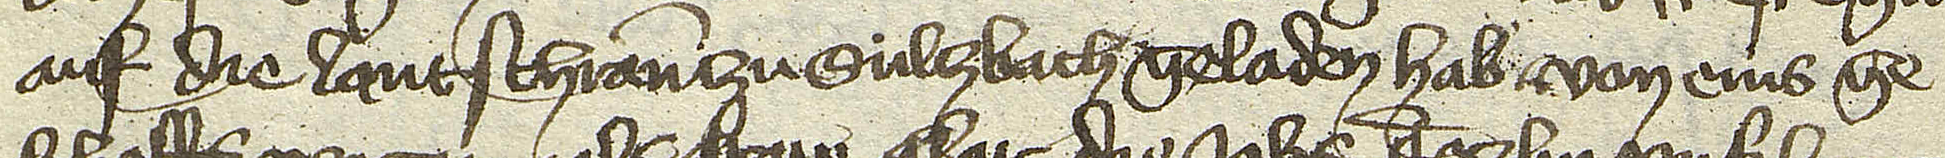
auf die lantſchran* cʒu Sulcʒbach geladen hab / von eins ge
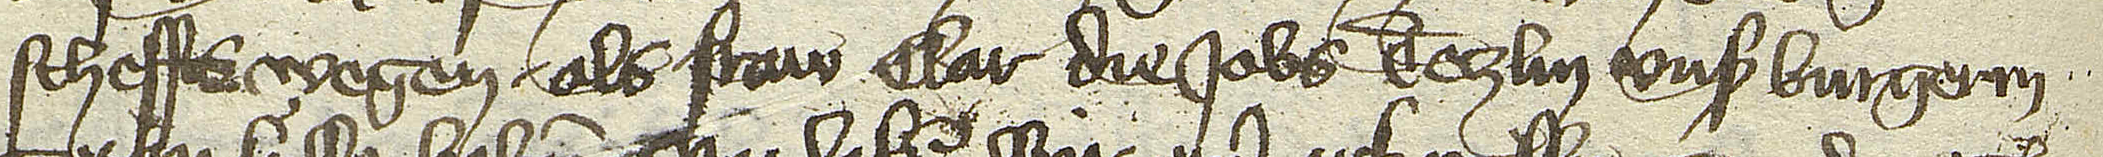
ſcheffts wegen / als fraw Clar die Iobs Tecʒlin vnſ* burgerin
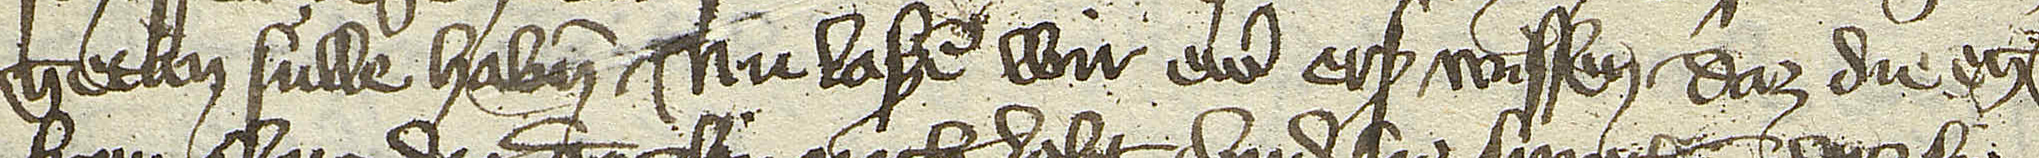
getan ſülle habn* / Nu laſʒe* wir ew* erſ* wiſſen / daʒ die eg*
